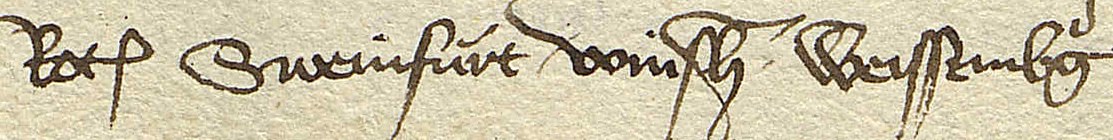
Rot* Sweinfürt / winſh* weiſſemb*g
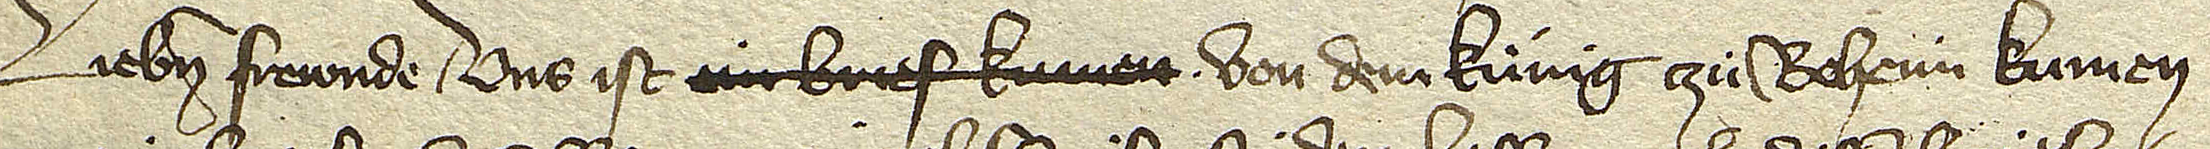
Liebn* frewnde / Vns iſt ein brief kumen . von dem künig cʒü Beheim kumen
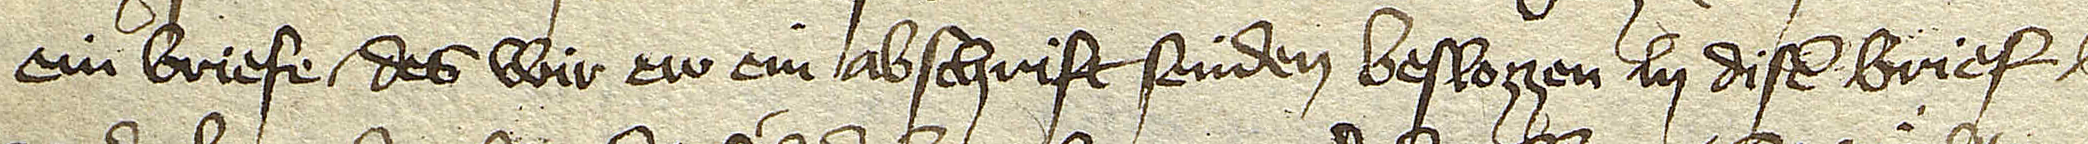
ein briefe / des wir ew ein abſchrift ſenden beſloʒʒen in diſe* brief /
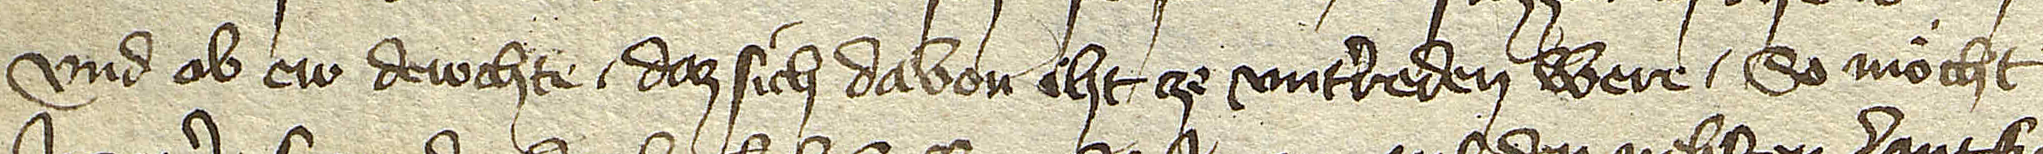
vnd ob ew dewchte / daʒ ſich davon iht cʒe vnt*reden were / So möcht
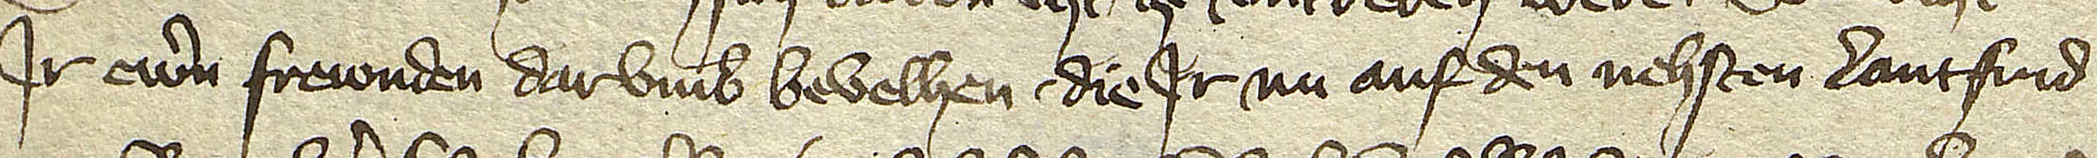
Ir ew*n frewnden darvmb bevelhen / die Ir nu auf den nehſten lantfrid
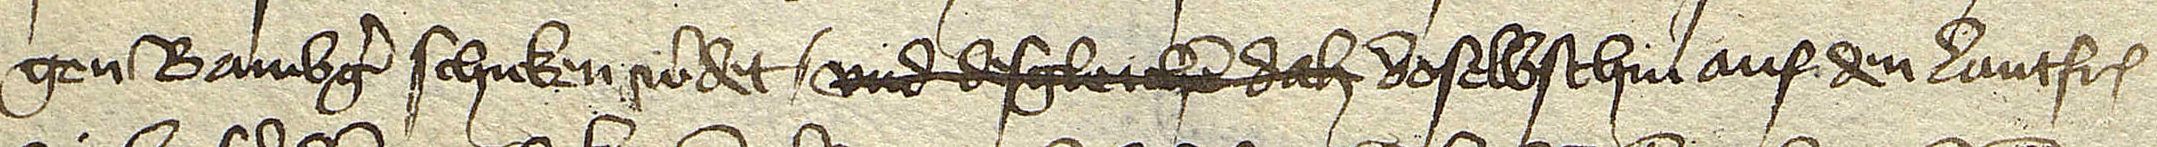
gen Bambg* ſchicken w*det / vnd deſgleiche* dah doſelbſt hin auf den lantfr*
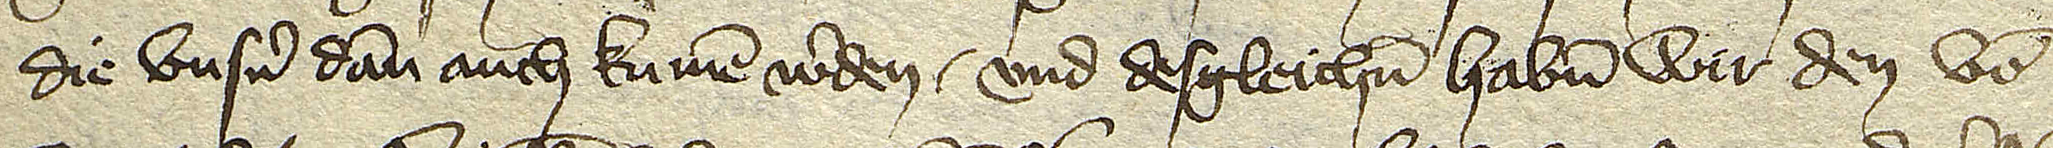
die vnſn* dan* auch kume* w*den / vnd deſgleichn* habn* wir den vo*
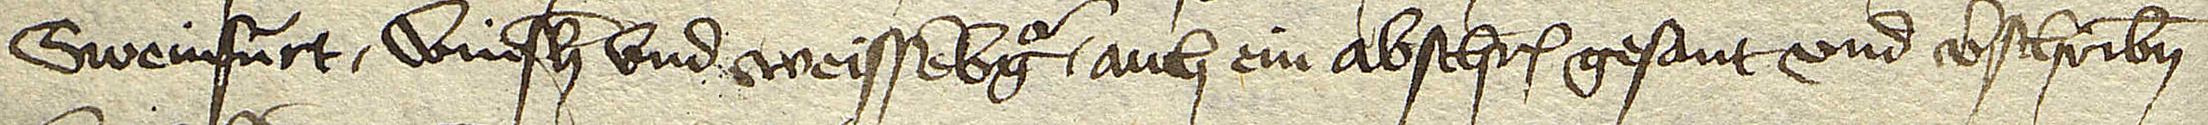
Sweinfürt / winſh* vnd weiſſe*b*g / auch ein abſchr* geſant vnd v*ſchribn*
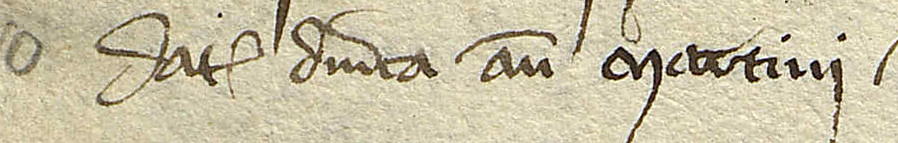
Dat* dmca* an* Martini /
